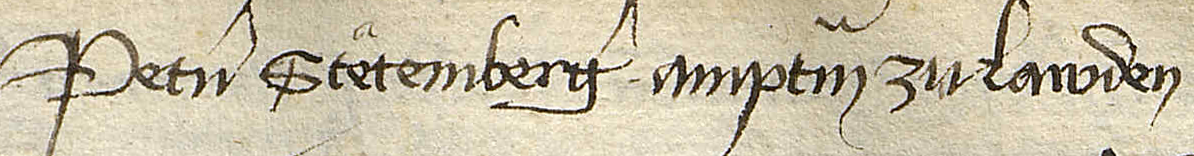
Petn* Stëtemberg* amptm* ʒu lawden
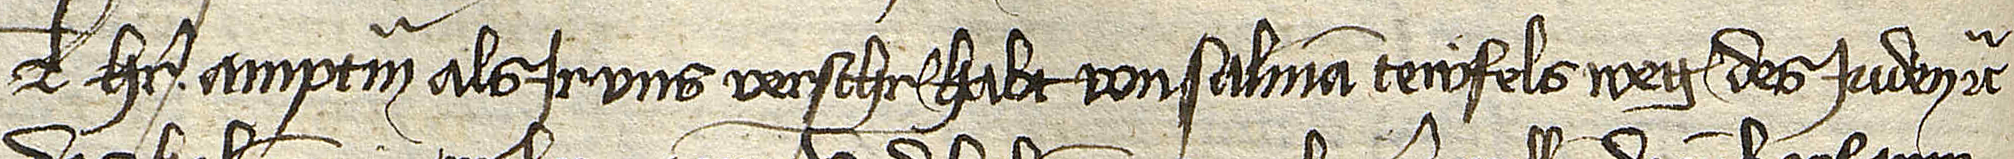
L* hr* amptm* als Ir vns verſchr* habt von ſalma* teẅfels weg* des Iuden ec*
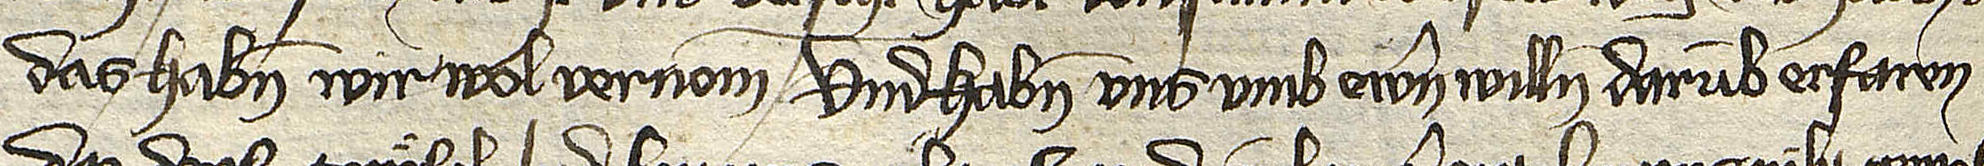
das habn* wir wol vernom* / Vnd habn* vns vmb eẅ*n willn* darub* erfaren
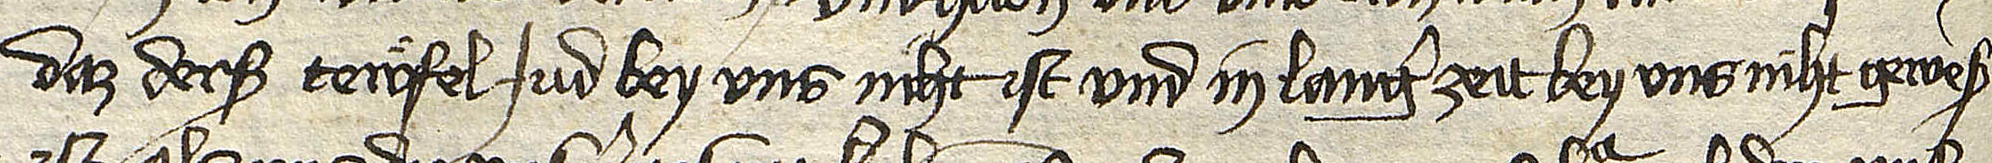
daʒ derſ* teẅfel Iud bey vns niht iſt vnd in lang* ʒeit bey vns niht geweſ*
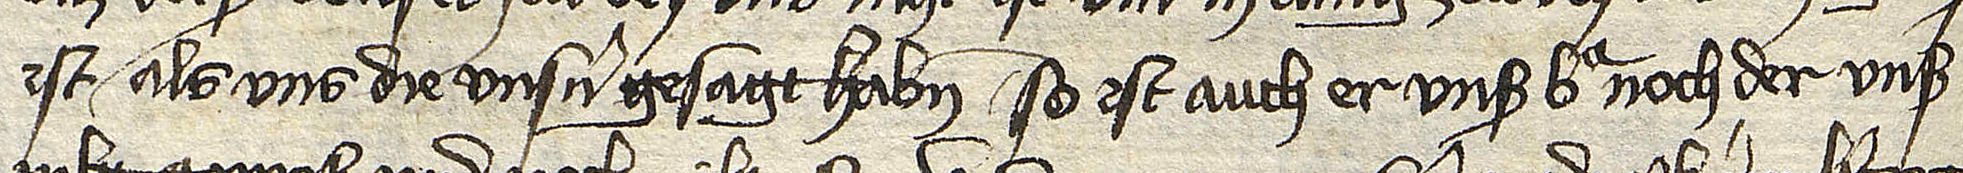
iſt als vns die vnſn* geſagt habn* / ſo iſt auch er vnſ* b* noch der vnſ*
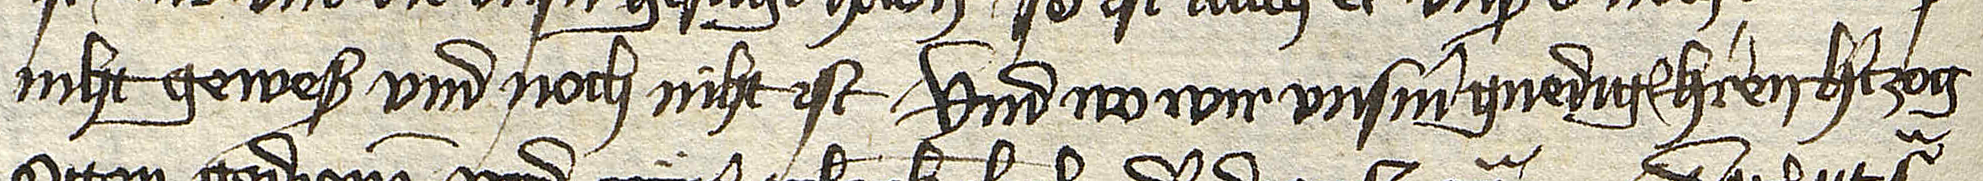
niht geweſ* vnd noch niht iſt / Vnd wo wir vnſm* gnedig* h*ren H*cʒog
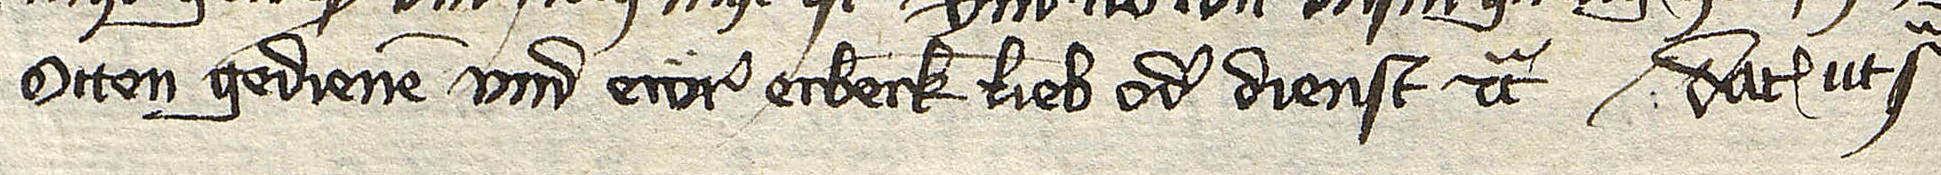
Otten gediene* vnd eẅr* erberk* lieb od* dienſt ec* / Dat* ut ſ*
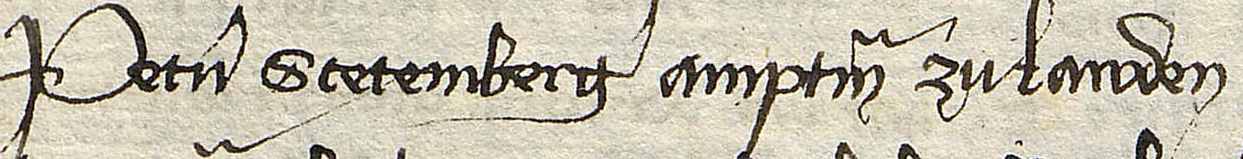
Petn* Stetemberg* amptm* ʒu Lawden
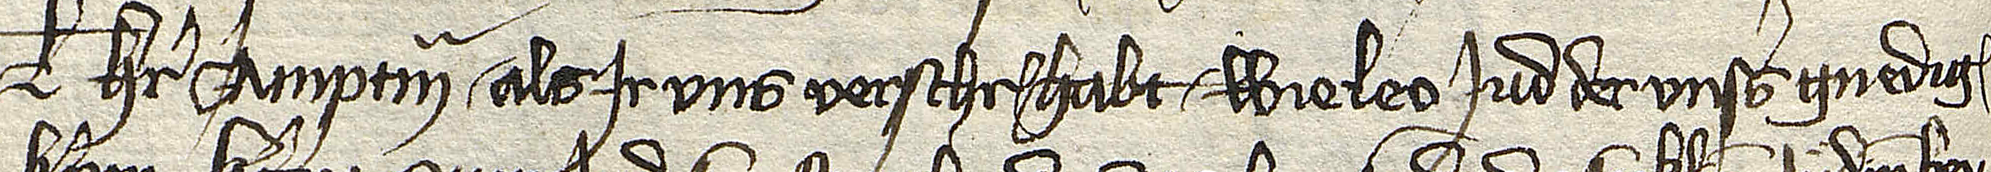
L* Hr* Amptm* / als Ir vns verſchr* habt / wie leo Iud der vnſs* gnedig*
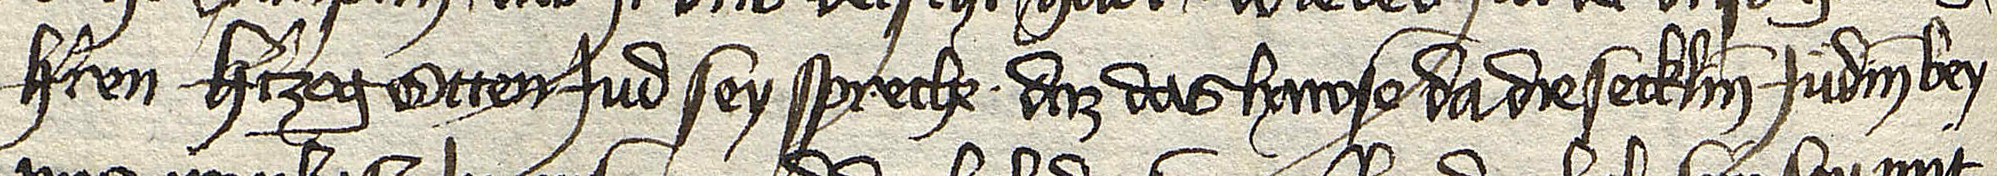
h*ren H*cʒog Otten Iud ſey ſpreche . daʒ das hawſe da die ſecklin* Iüdin* bey
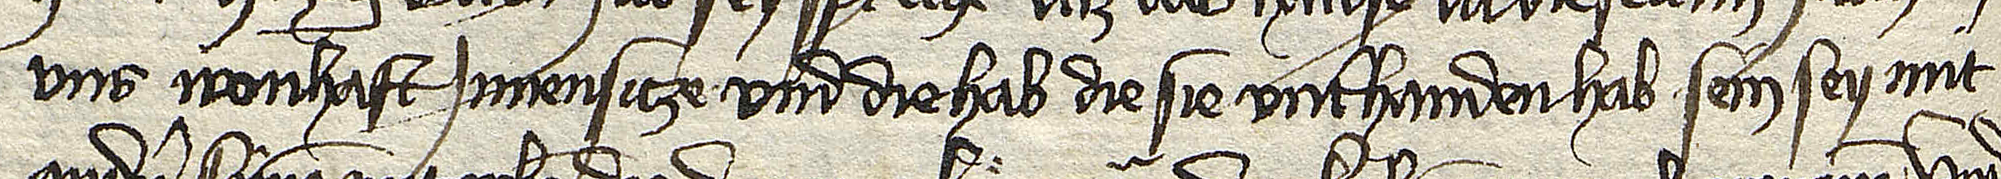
vns wonhaft Innenſicʒe vnd die hab die ſie vnt*handen hab ſein ſey mit
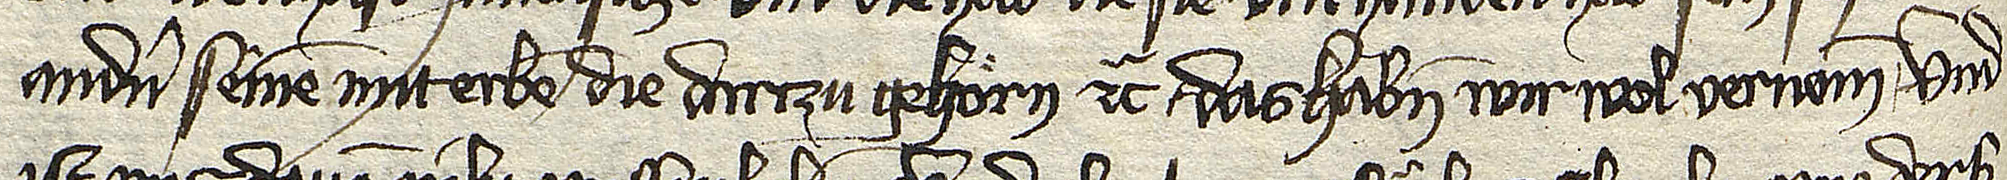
andn* ſeine* mit erbe* die darcʒu gehörn ec* / Das habn* wir wol vernom* / Vnd
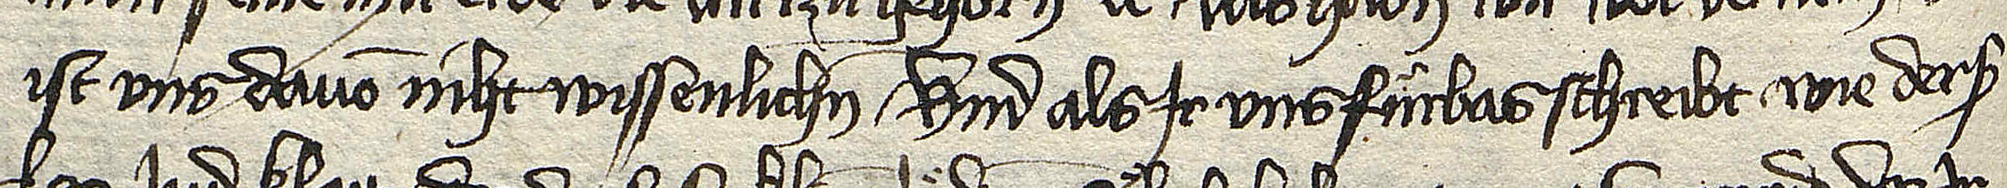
iſt vns dauo* niht wiſſenlichn* / Vnd als Ir vns fürbas ſchreibt wie derſ*
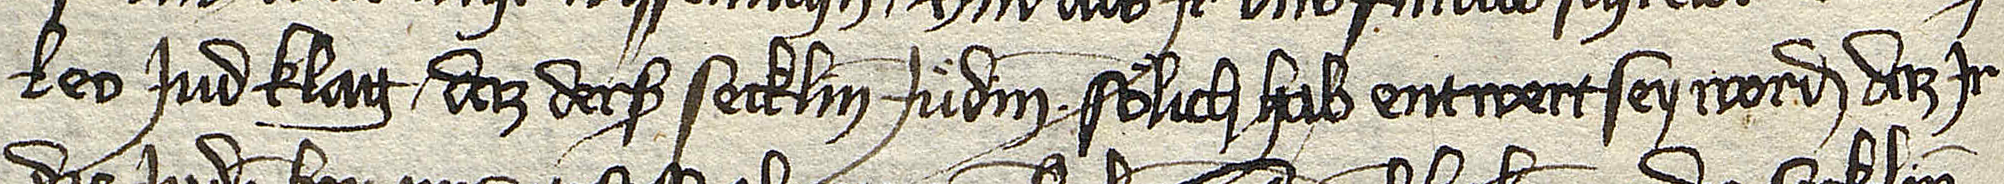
leo Iud klag / daʒ derſ* ſecklin* Iüdin* . ſölich hab entwert ſey word* daʒ Ir
